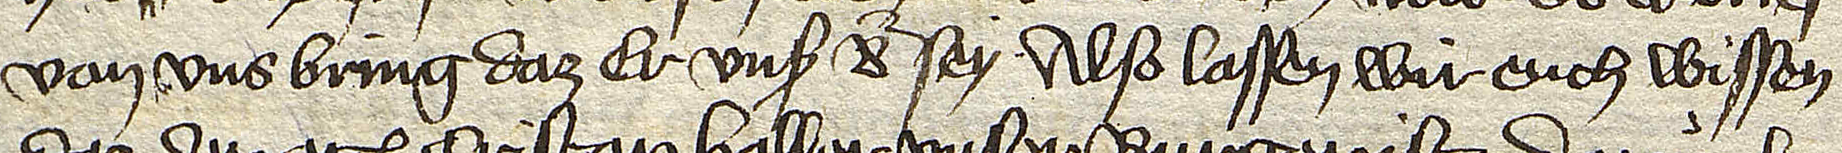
von vns bring daʒ Er vnſ* B* ſey . Alſo laſſen wir euch wiſſen
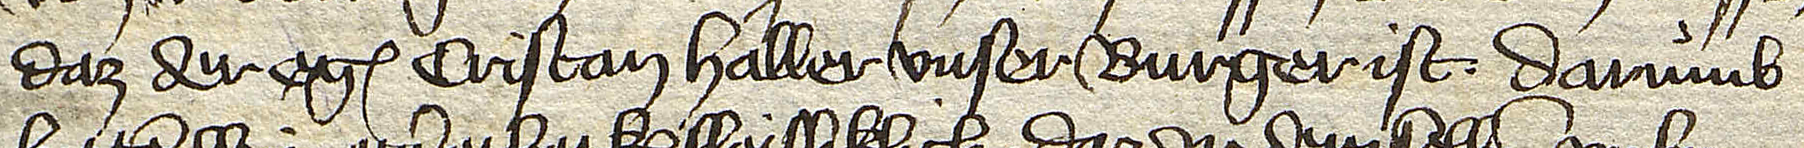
daʒ der eg* Criſtan haller vnſer Burger iſt . Darümb
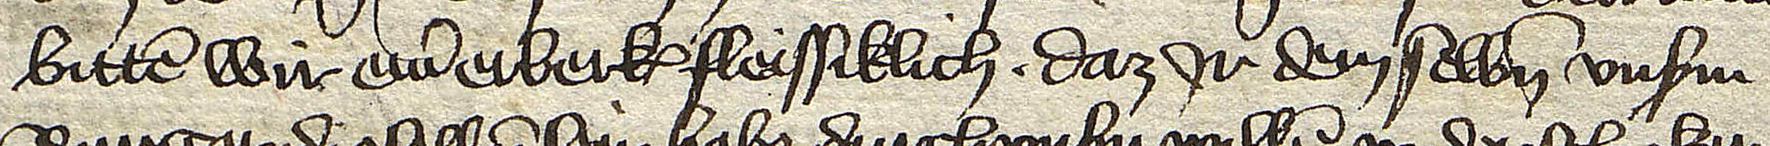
bitte* wir ew* erberk* fleiſſiklich . daʒ Ir demſelbn* vnſ*m
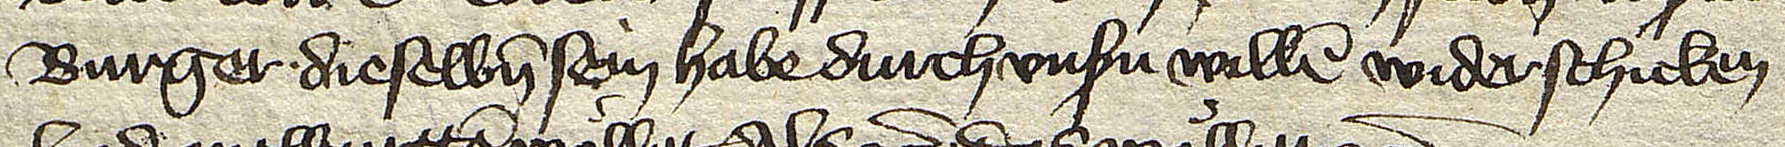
Burger . dieſelbn* ſein habe durch vnſ*n wille* widerſchicken
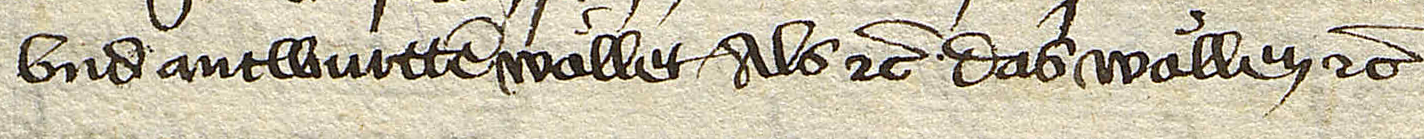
vnd antwurtte* wöllet / Als ec* Das wöllen ec*
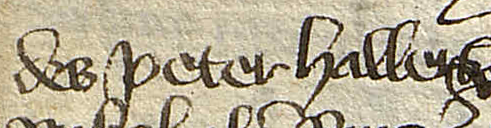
des Peter hallers
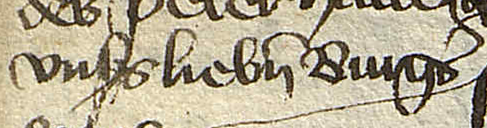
vnſ*s liebn* Burgs*
